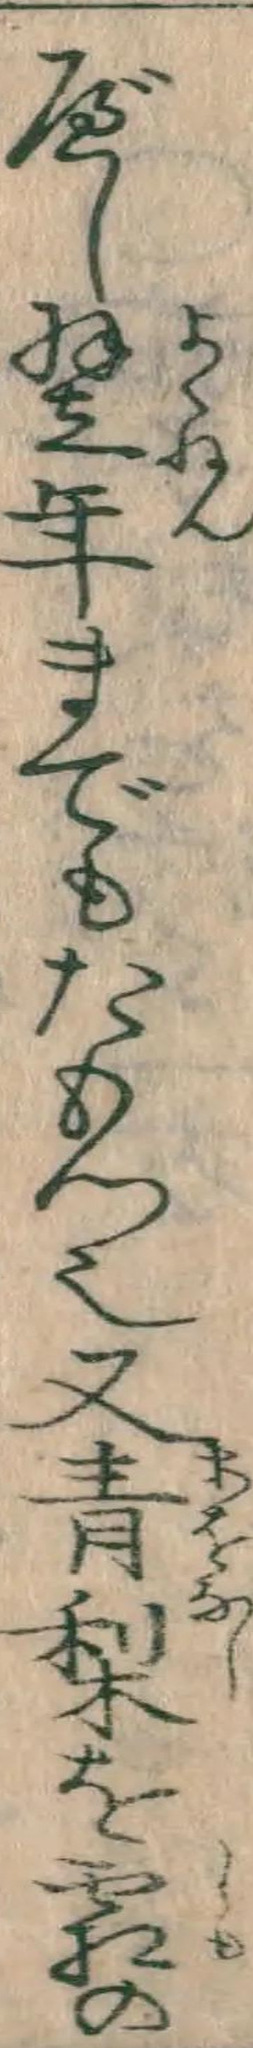べし翌年までもたもつ也又青梨を霜の
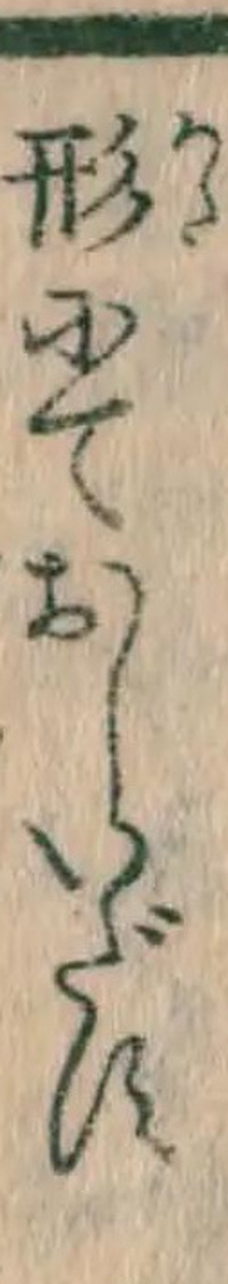形にておしいだす
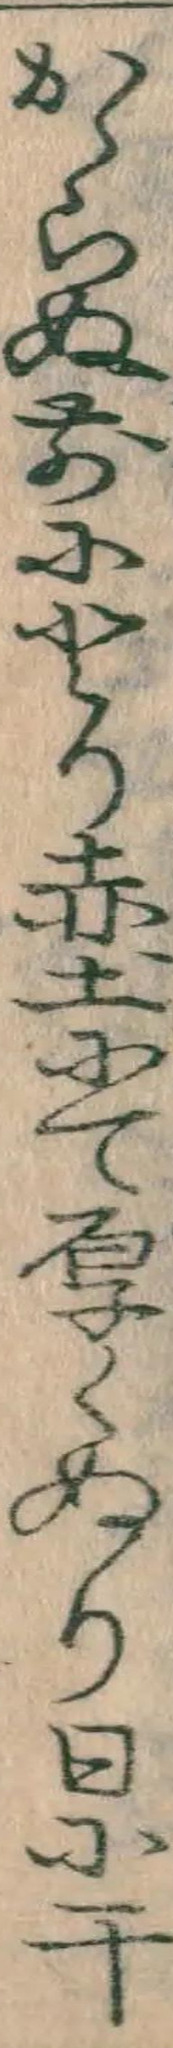かゝらぬ前にとり赤土にて厚くぬり日に干
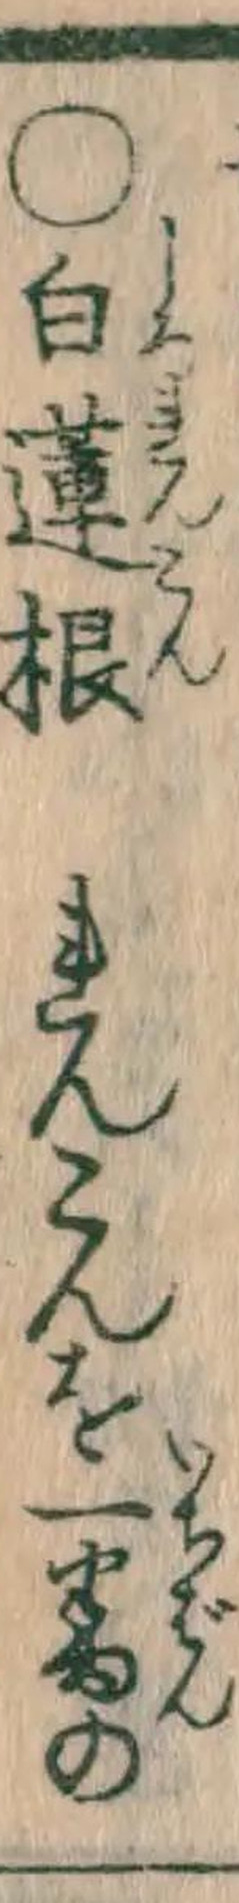○白蓮根れんこんを一番の
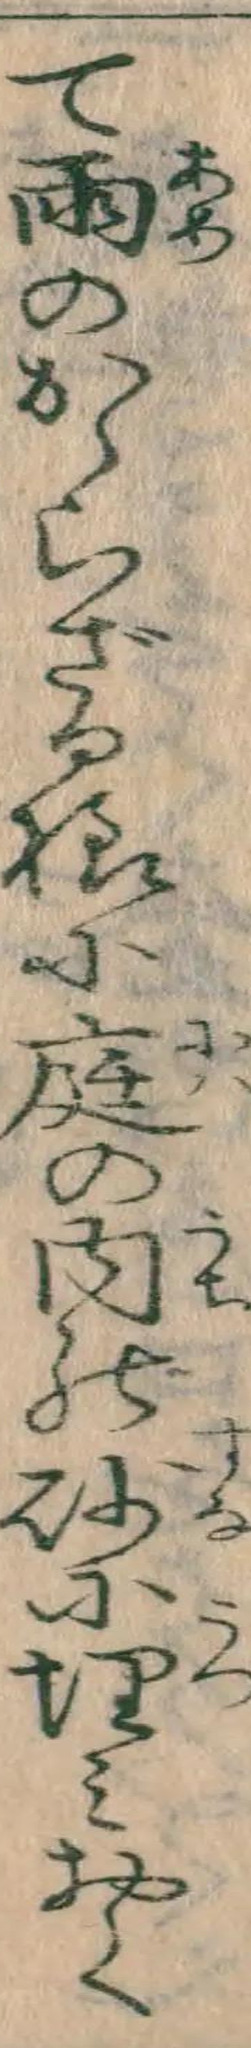て雨のかゝらざる様に庭の内の砂に埋みおく
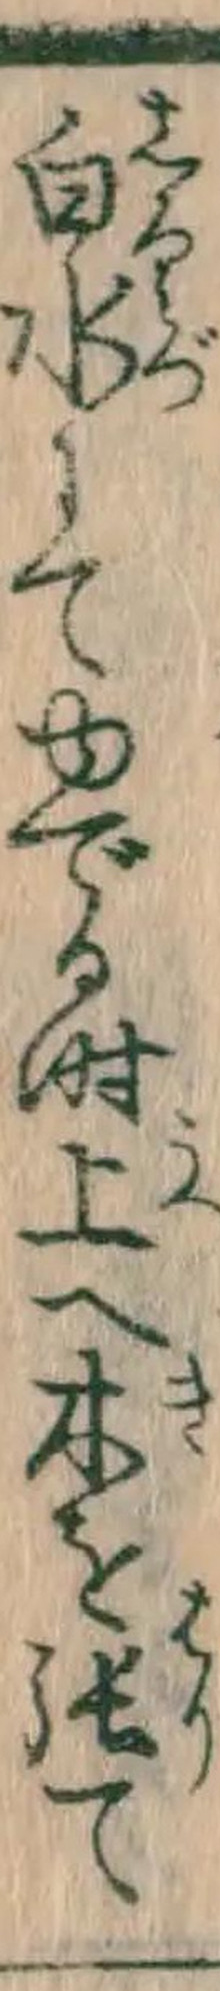白水にてゆでる時上へ木を張て
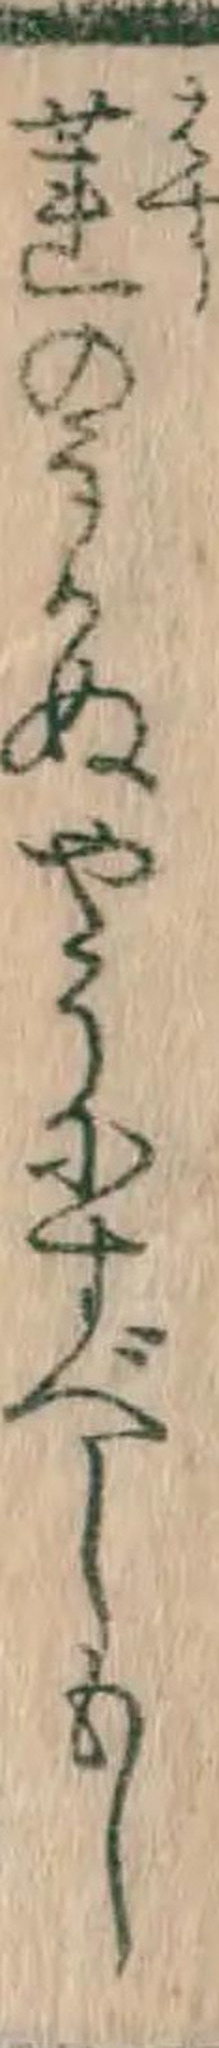蓮のうかぬやうにすべしもし
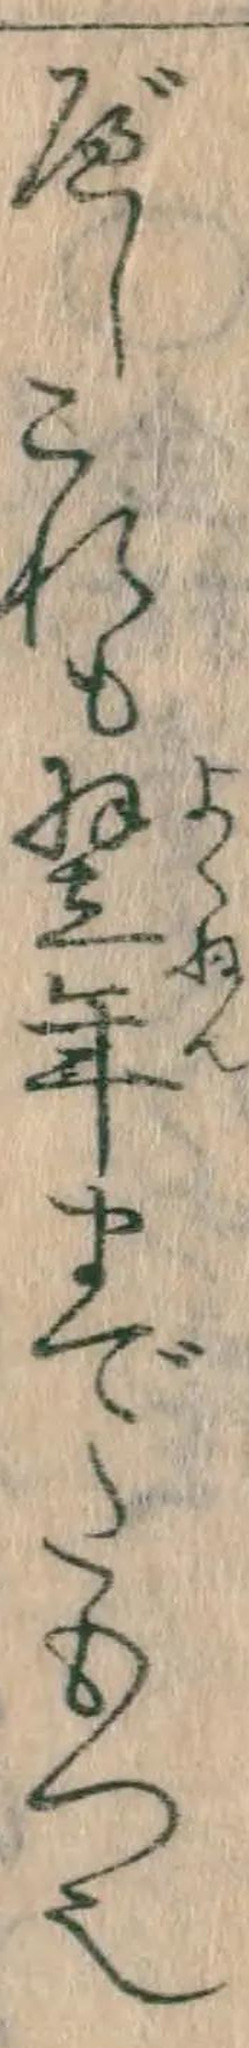べしこれも翌年までたもつ也
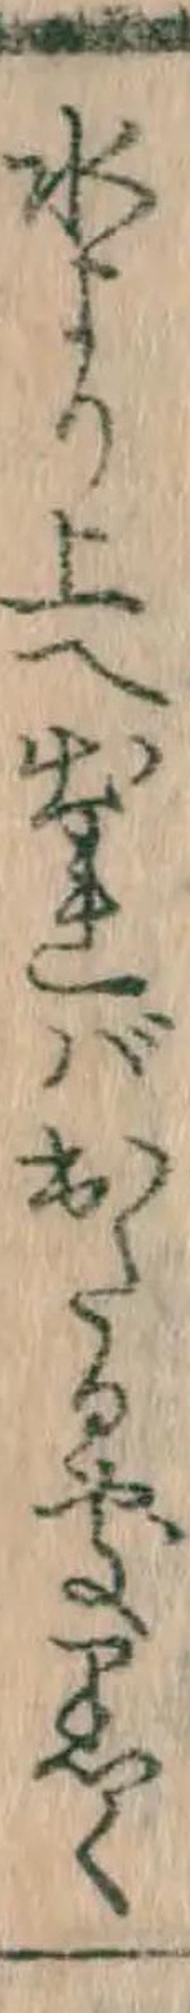水より上へ出れば出たる処黒く
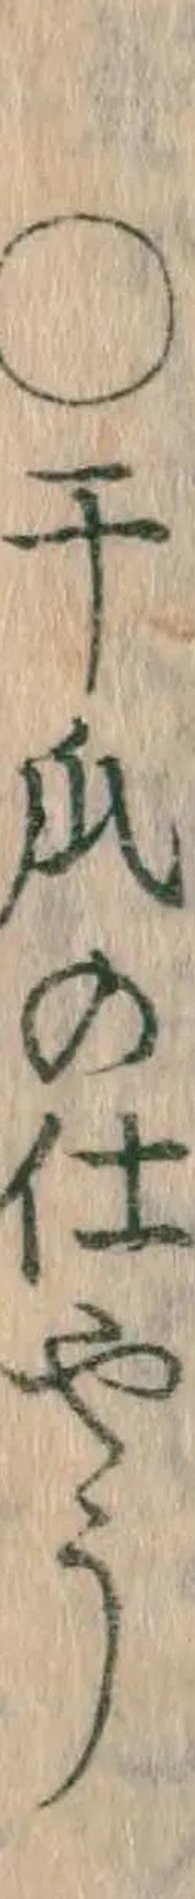○干瓜の仕やう
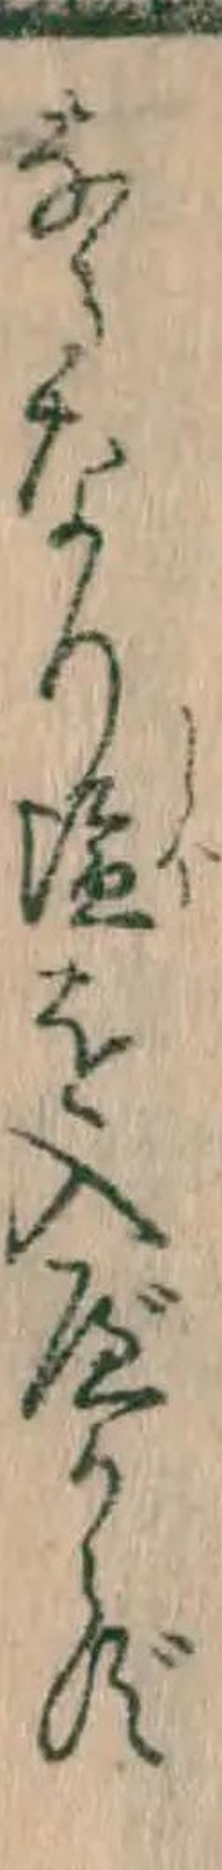なるなり塩を入べからず
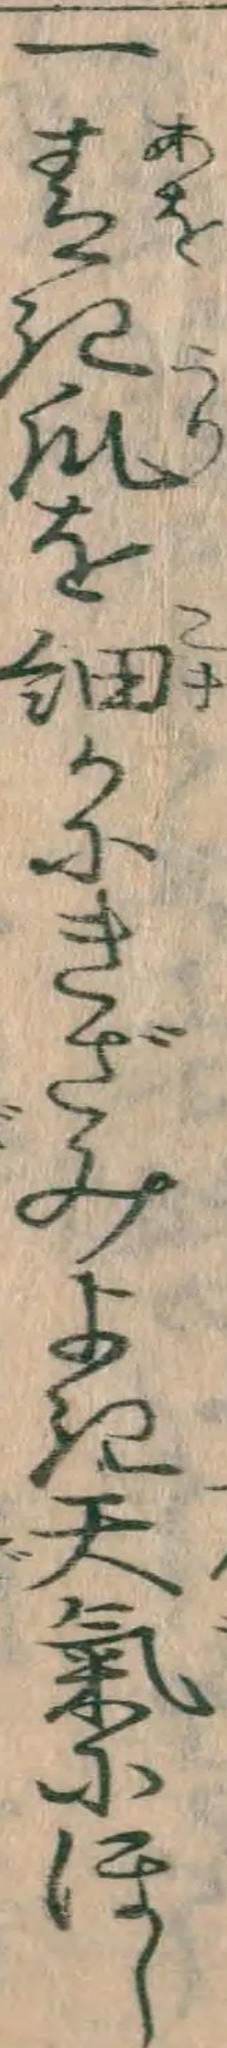一青き瓜を細かにきざみよき天気にほし
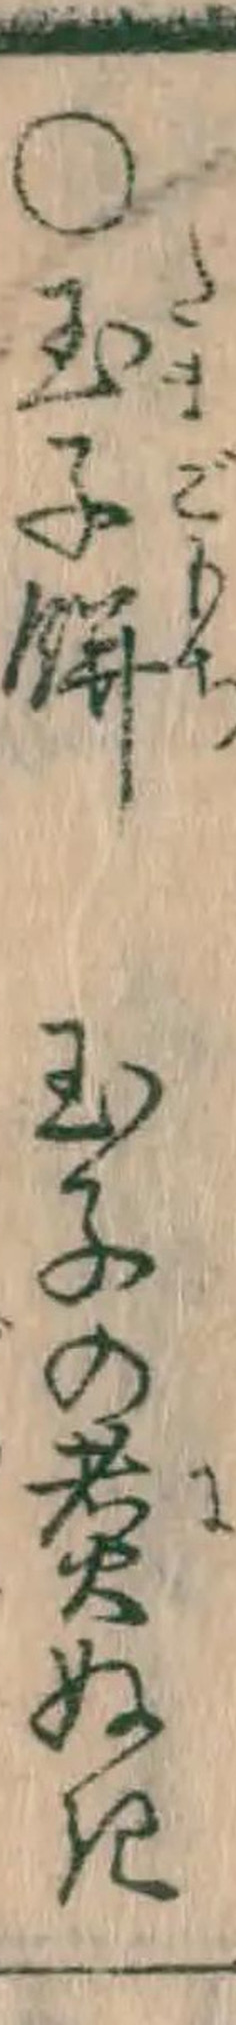○玉子餅玉子の煮ぬき
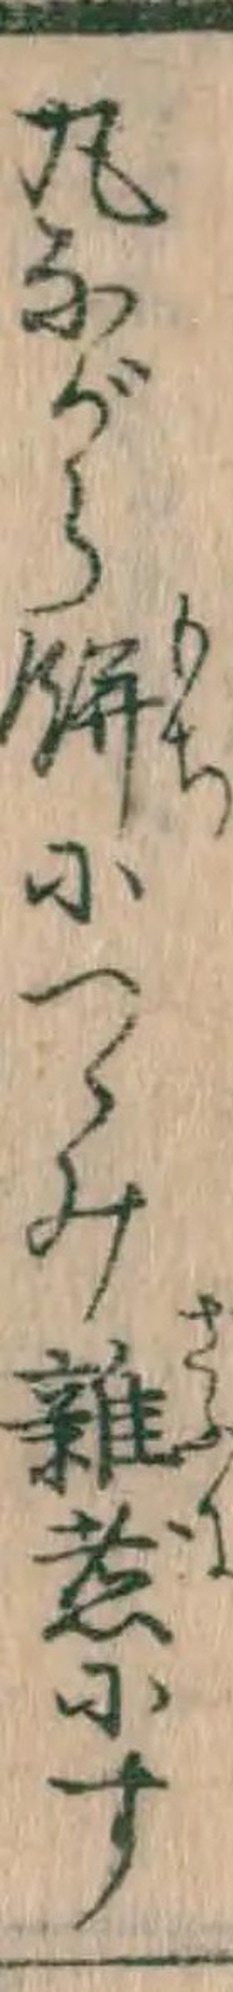丸ながら餅につゝみ雑煮にす
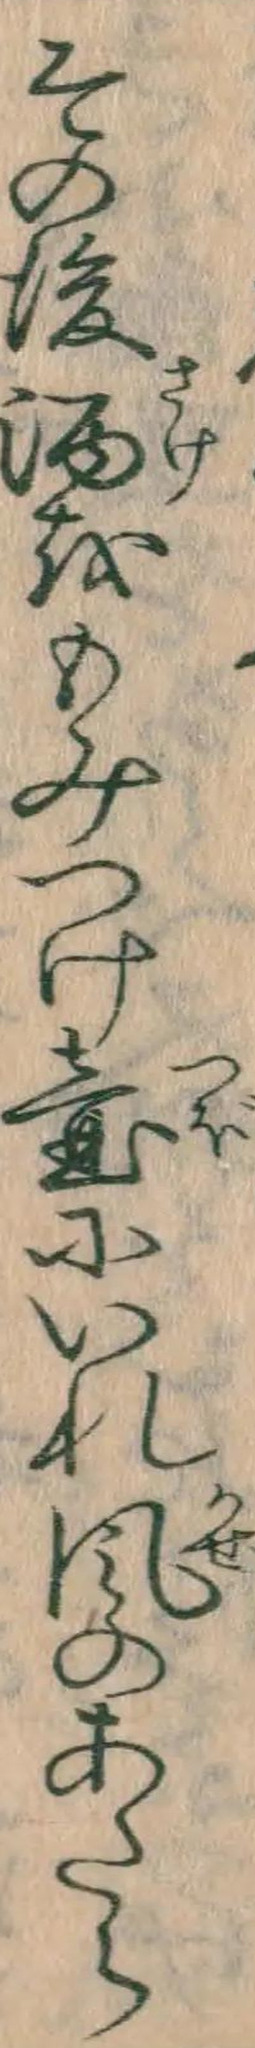その後酒をもみつけ壺にいれ風のあたら
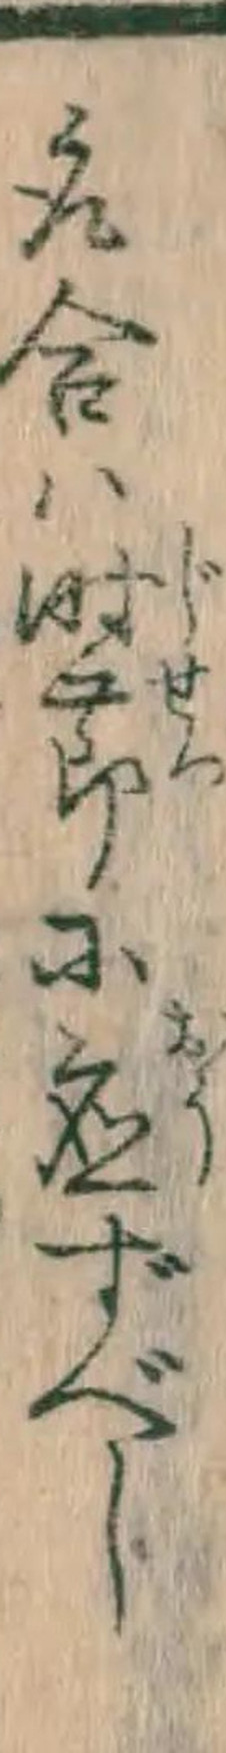取合は時節に応ずべし
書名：広益秘事大全 3巻. [5]
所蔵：国立国会図書館 National Diet Library, JAPAN
